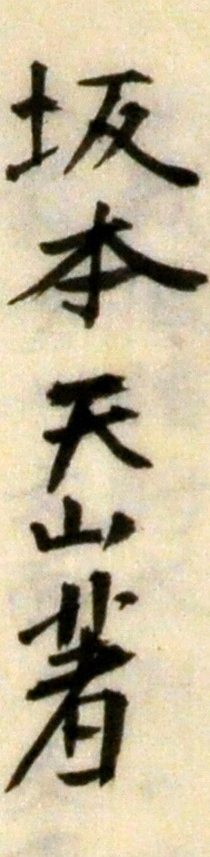坂本天山著
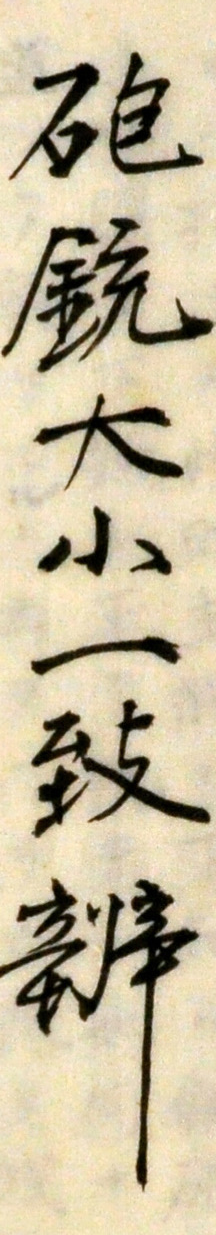砲銃大小一致辨
